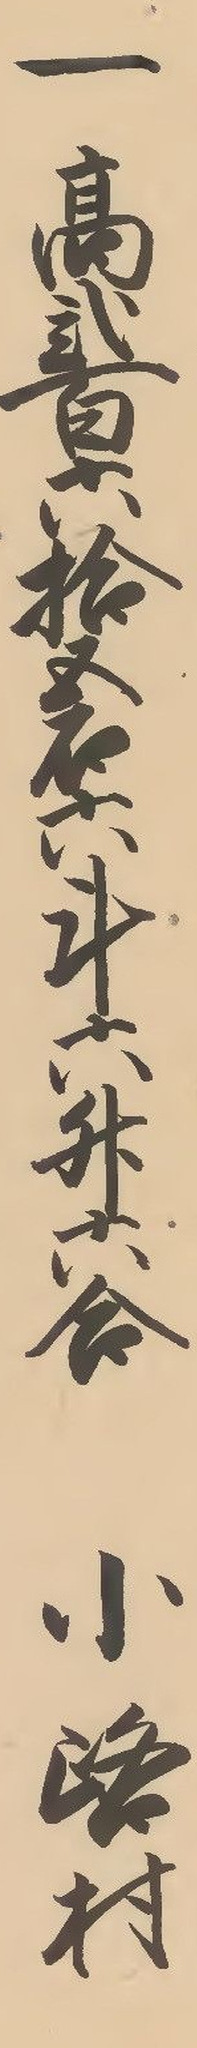一高弐百六拾五石六斗六升六合小路村
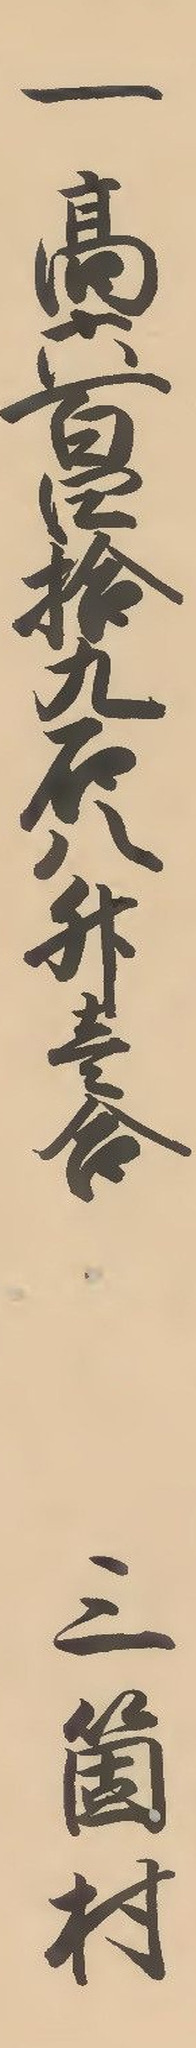一高六百四拾九石八升壱合三箇村
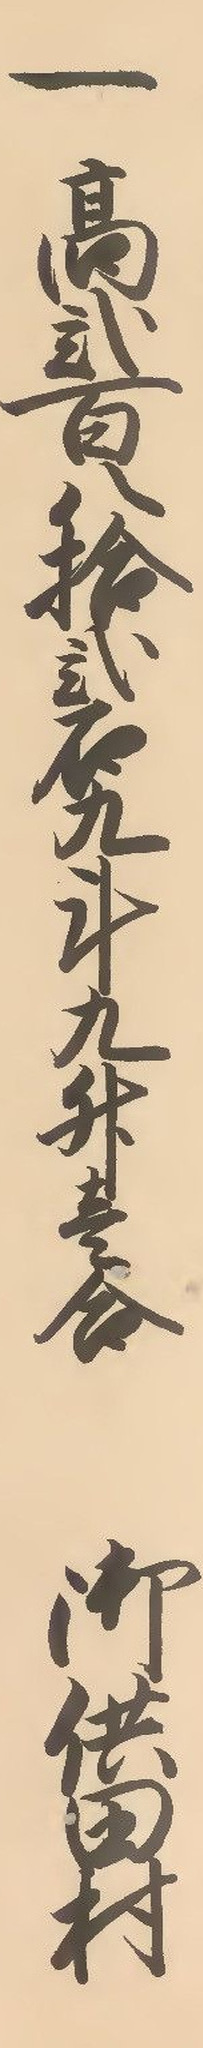一高弐百八拾弐石九斗九升壱合御供田村
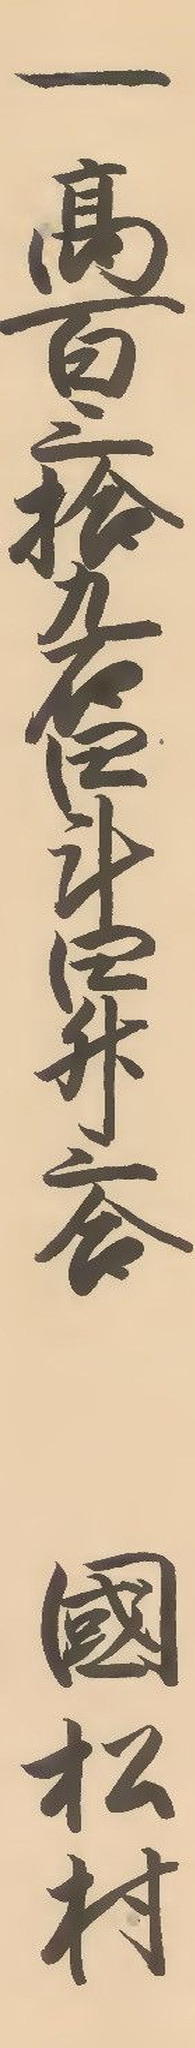一高百三拾九石四斗四升三合国松村
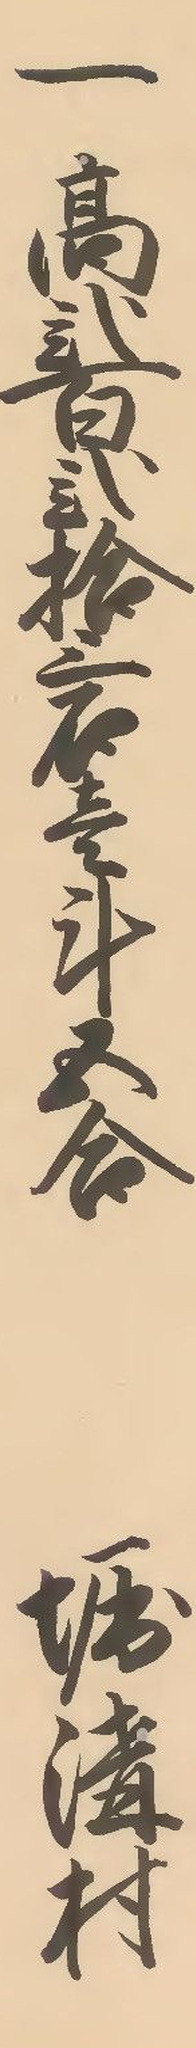一高弐百弐拾三石壱斗五合堀溝村
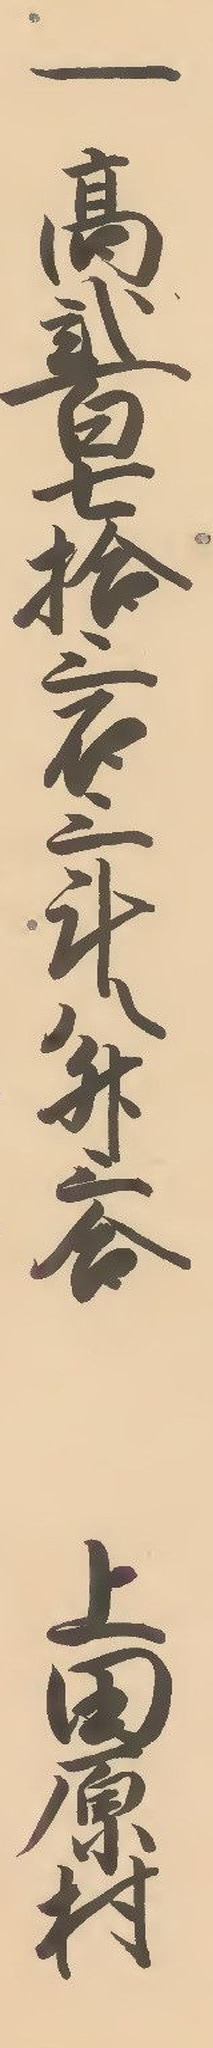一高弐百七拾三石三斗八升三合上田原村

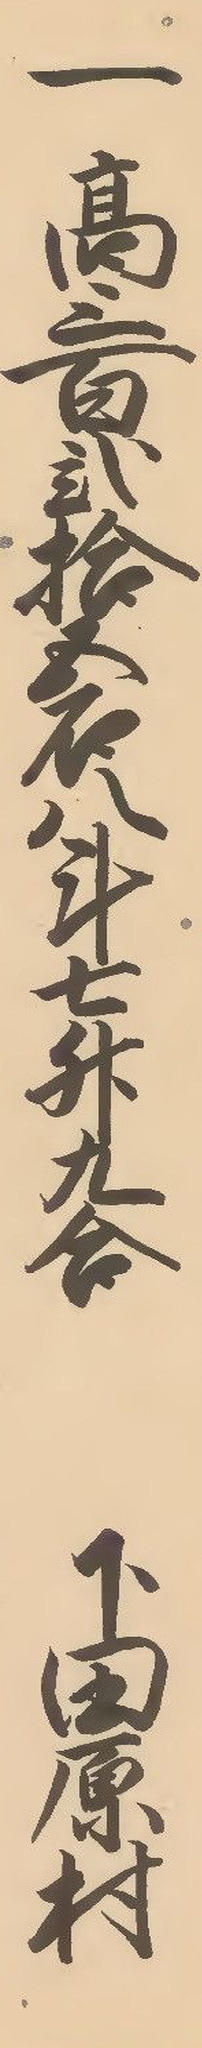一高三百弐拾五石八斗七升九合下田原村
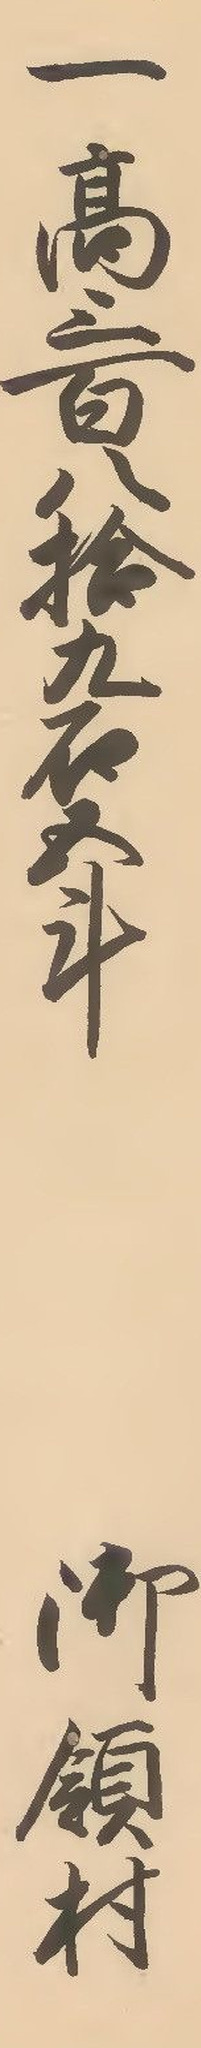一高三百八拾九石五斗御領村
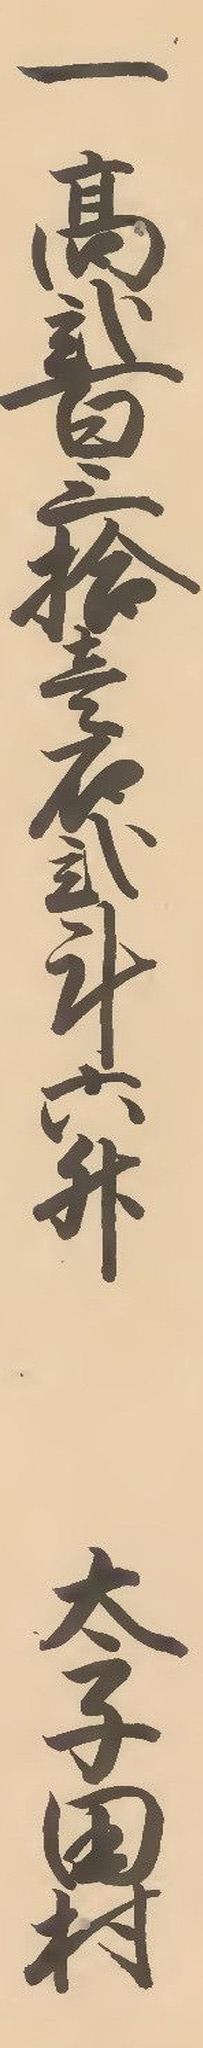一高弐百三拾壱石弐斗六升太子田村
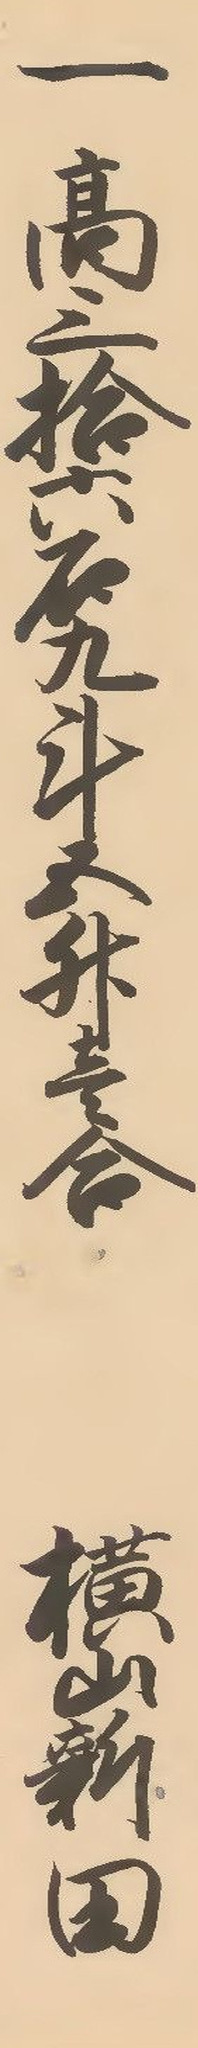一高三拾六石九斗五升壱合横山新田
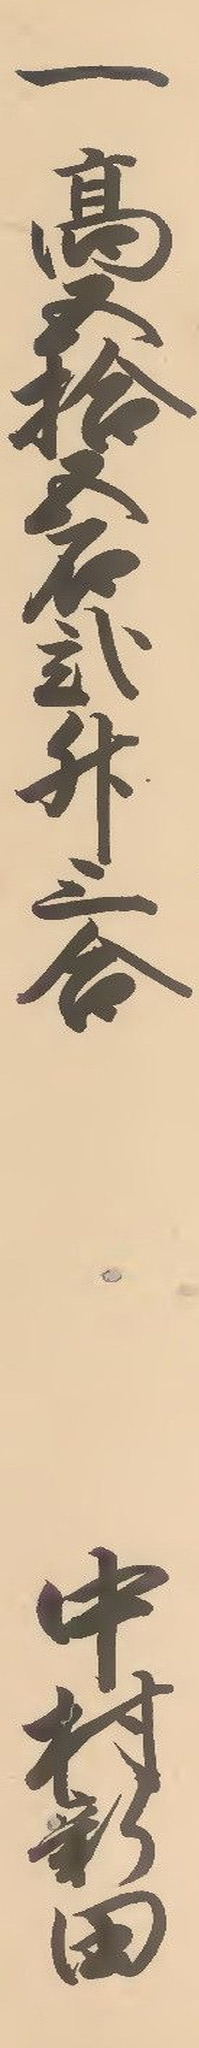一高五拾五石弐升三合中村新田
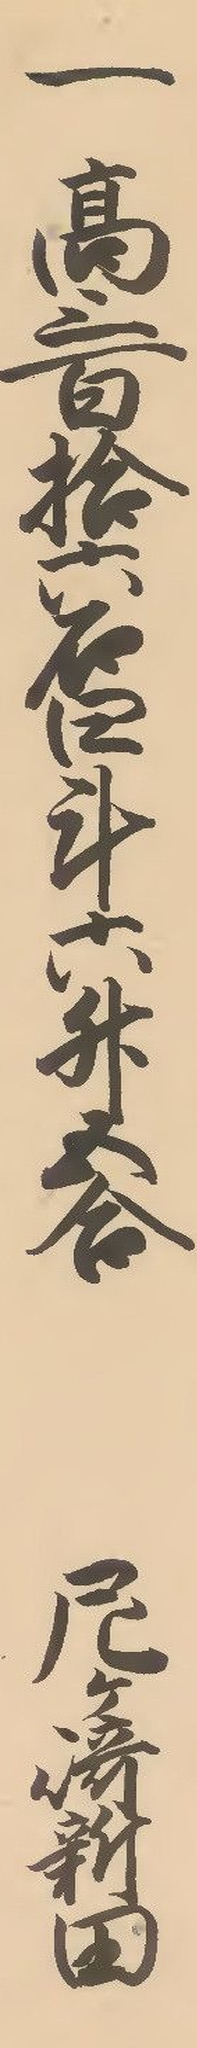一高三百拾六石四斗六升五合尼ヶ崎新田
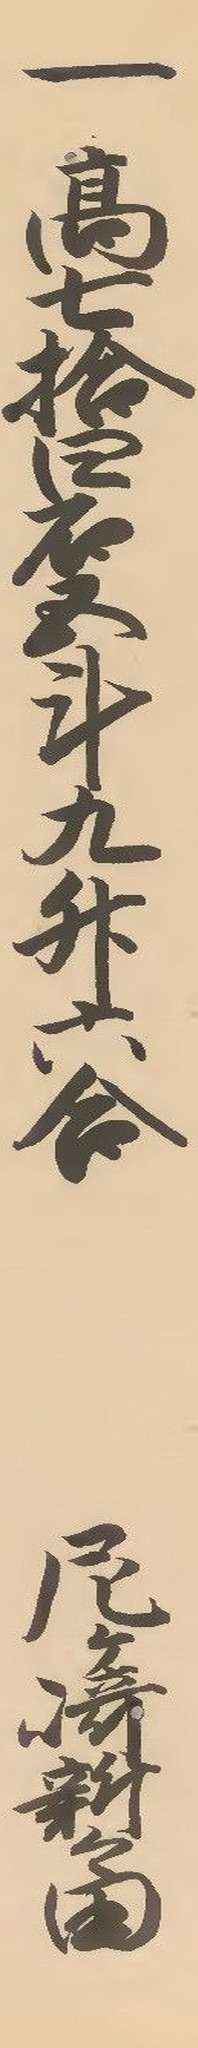一高七拾四石五斗九升六合尼ヶ崎新々田
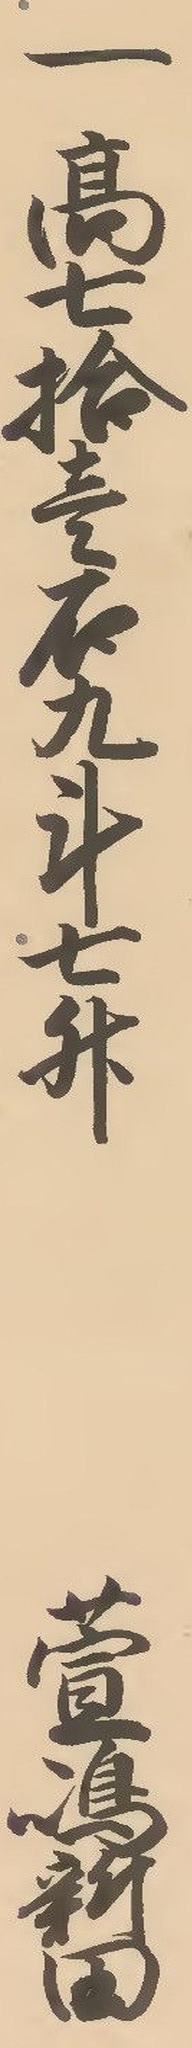一高七拾壱石九斗七升萱島新田

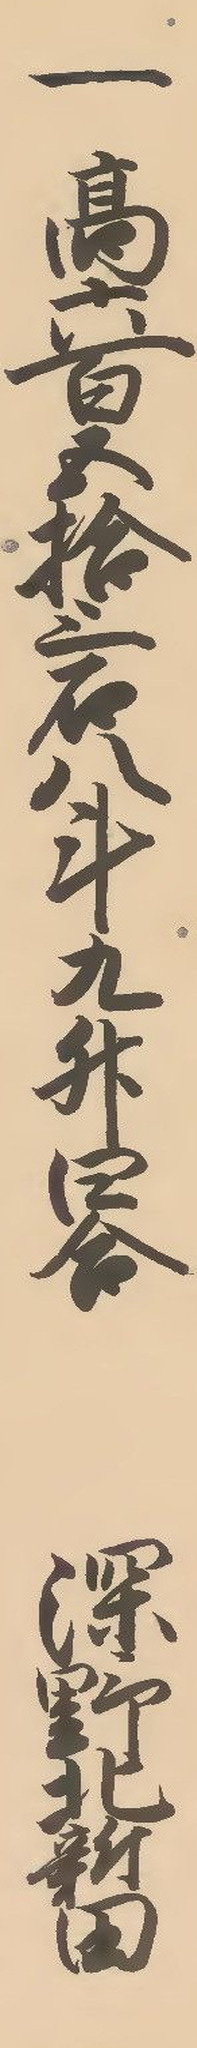一高六百五拾三石八斗九升四合深野北新田
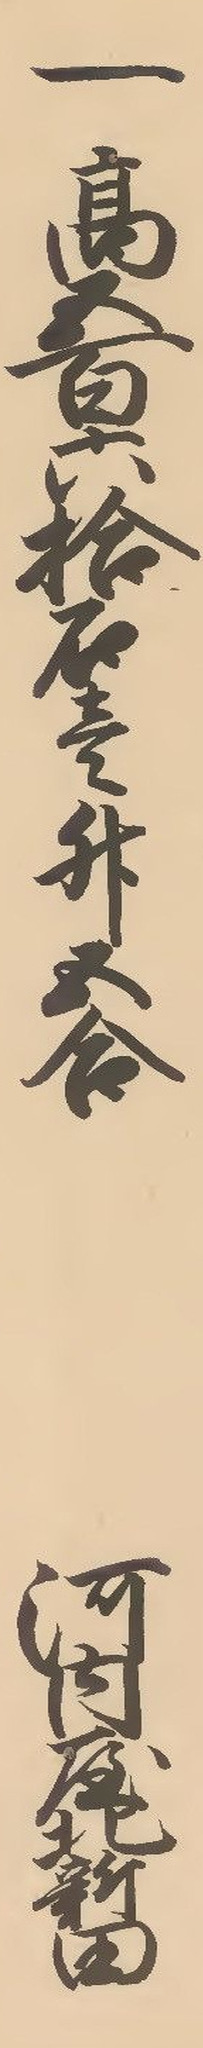一高五百六拾石壱升五合河内屋北新田
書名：河内国郷帳
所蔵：国立公文書館 National Archives of Japan
